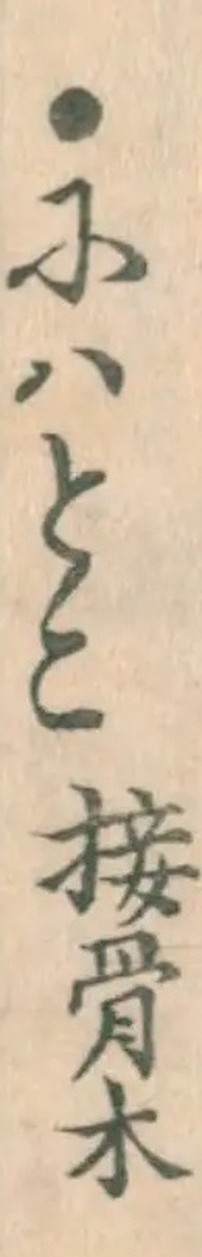●にハとこ接骨木
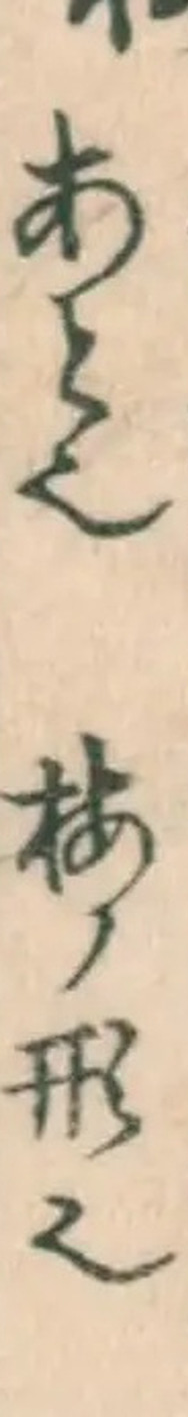あと也梅のノ形
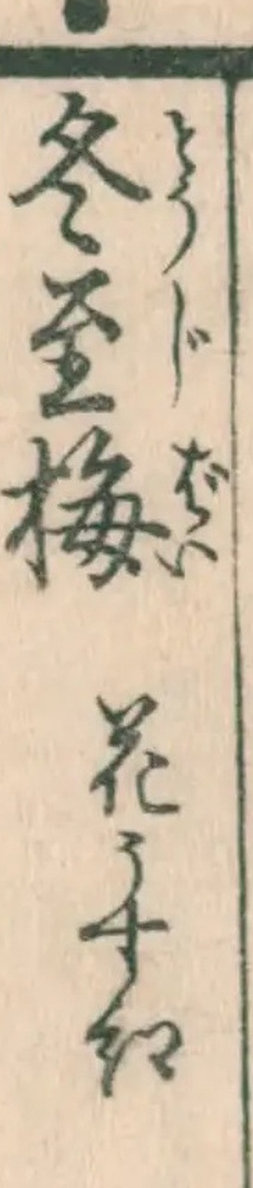冬至梅花うす紅
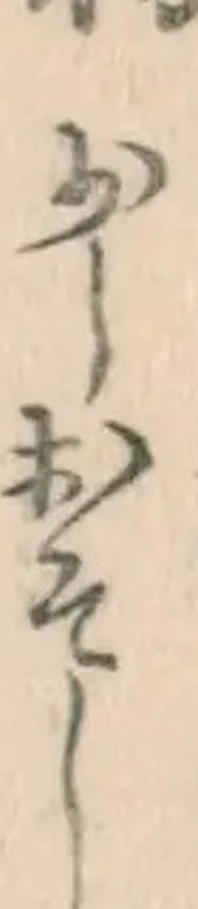少しおそし
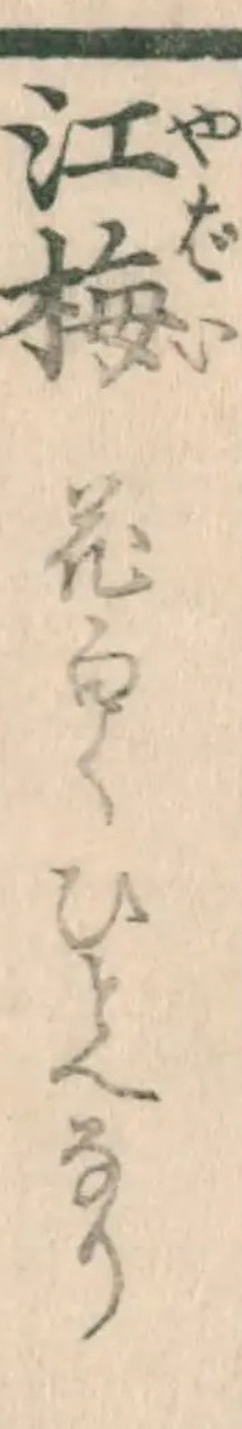江梅花白くひとへなり
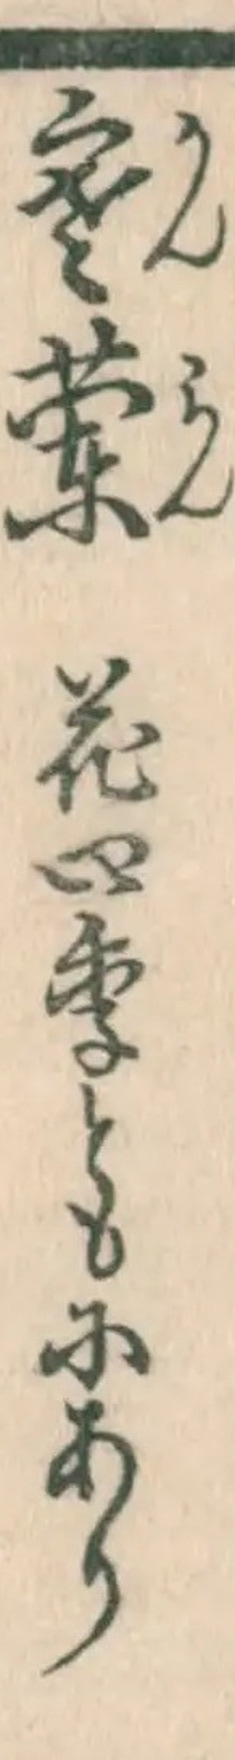寒蘭花式四季ともにあり
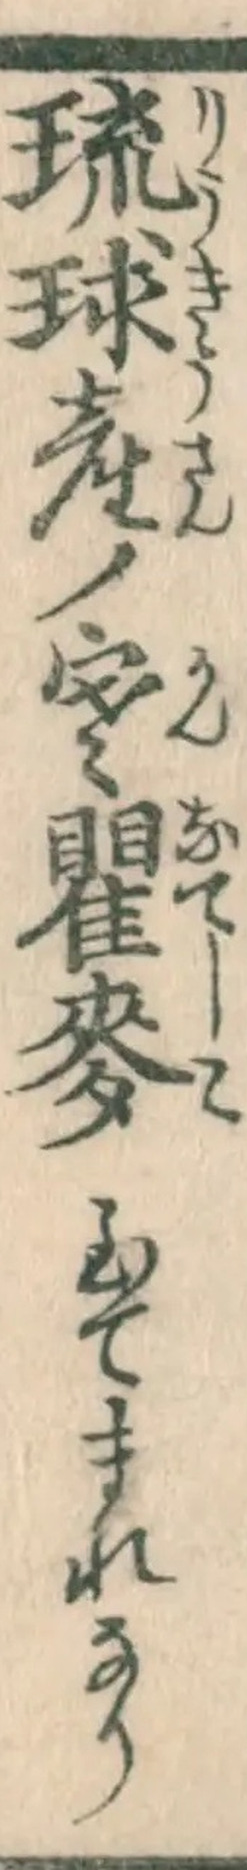琉球産の寒雚麥至てまれなり
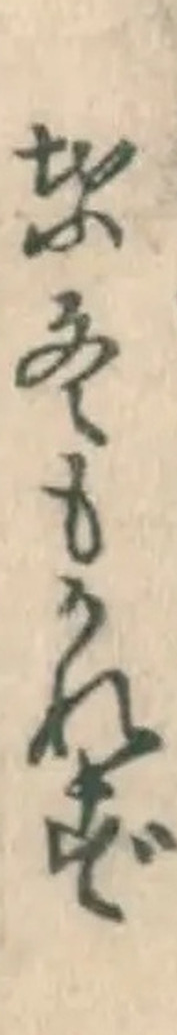葉冬もかれず

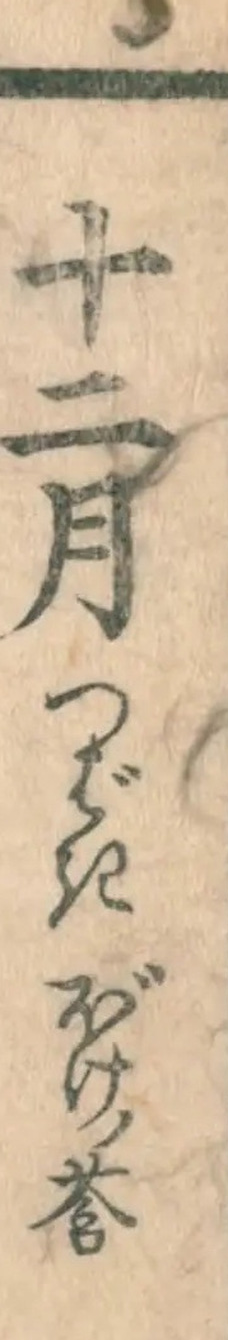十二月つばきぼけノ莟
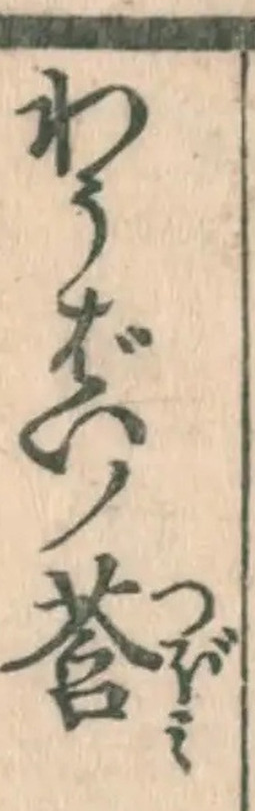わうばいノ莟

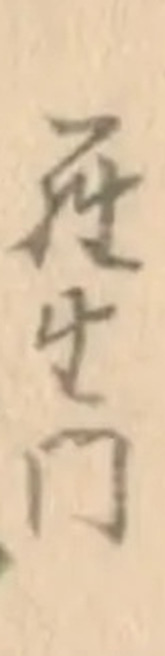羅生門
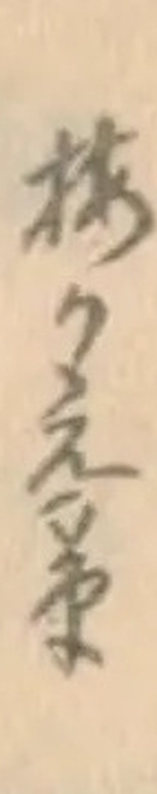梅かえ草

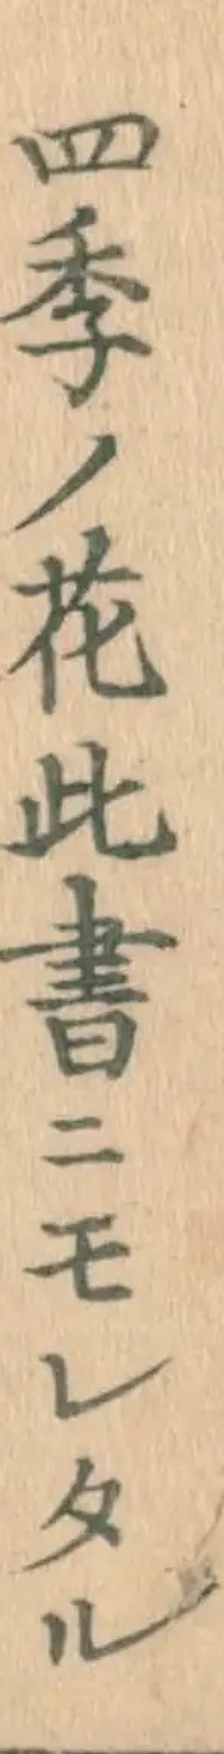四季ノ花此書ニモレタル
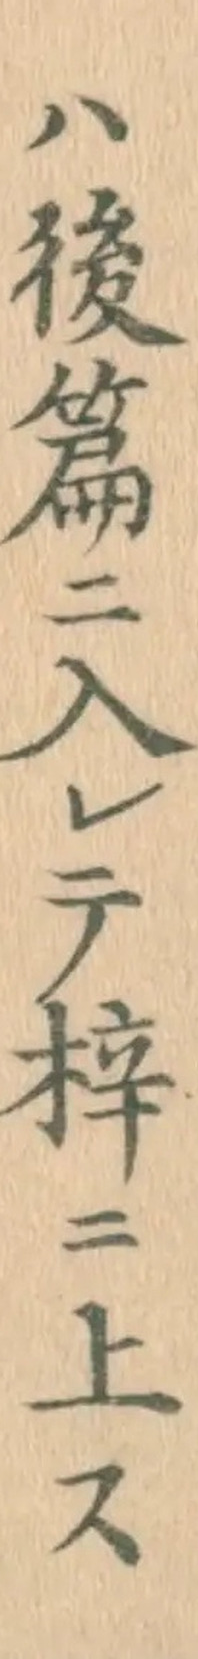ハ後篇ニ入レテ梓ニ上ス
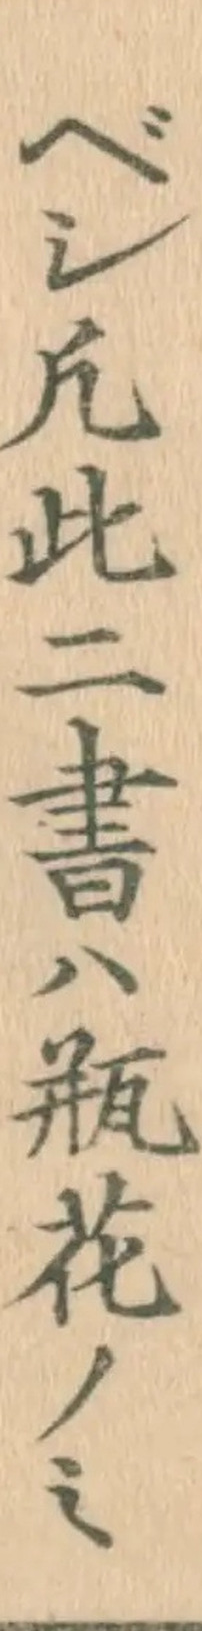ベシ凡此ニ書ハ瓶花ノミ
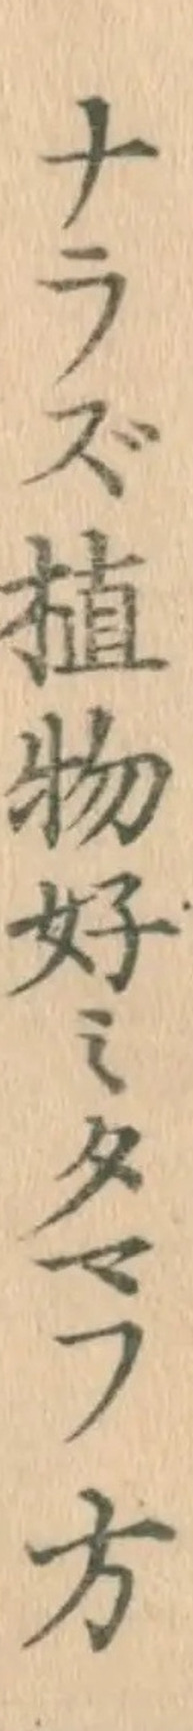ナラズ植物好ミタマフ方
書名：茶席挿花集
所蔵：国立国会図書館 National Diet Library, JAPAN
